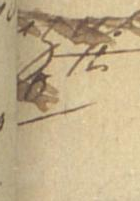0^th
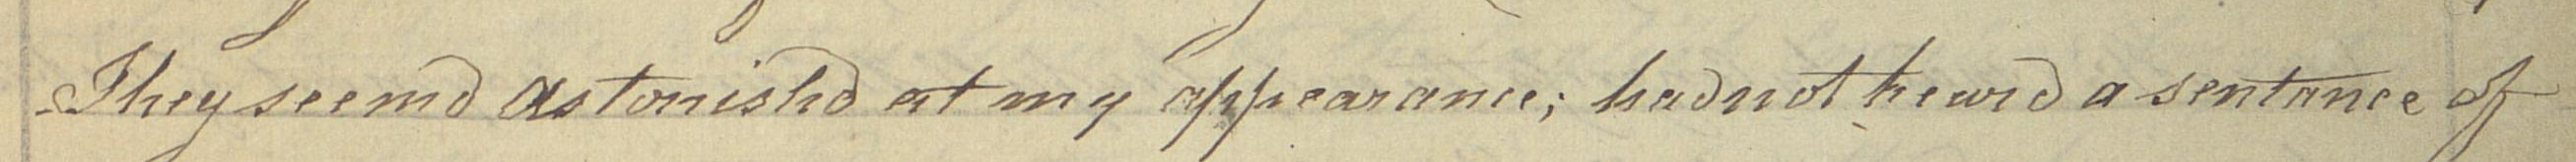They seemd astonished at my appearance; had not heard a sentance of
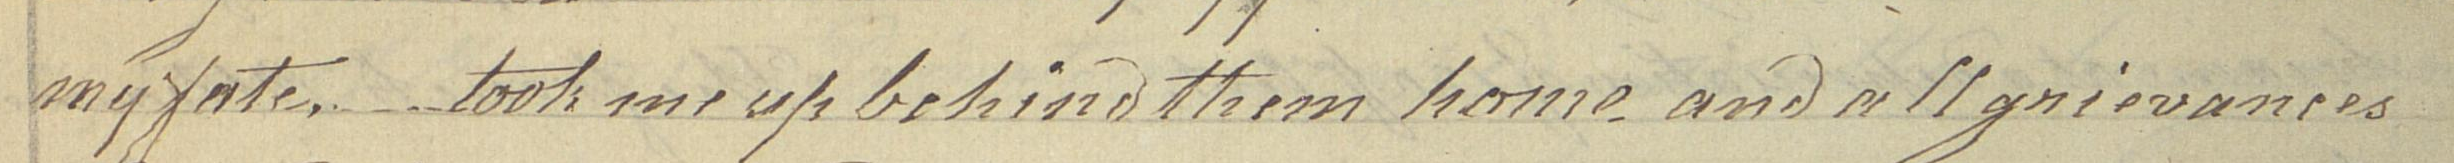my fate. took me up behind them home and all grievances
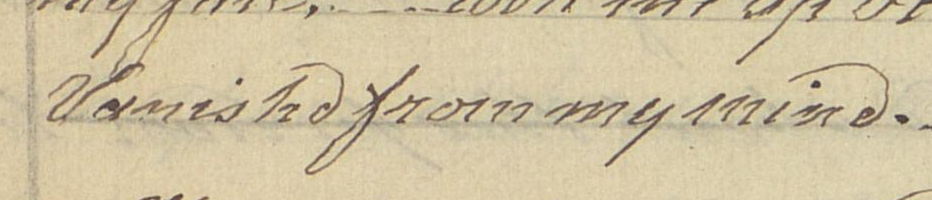Vanishd from my mind
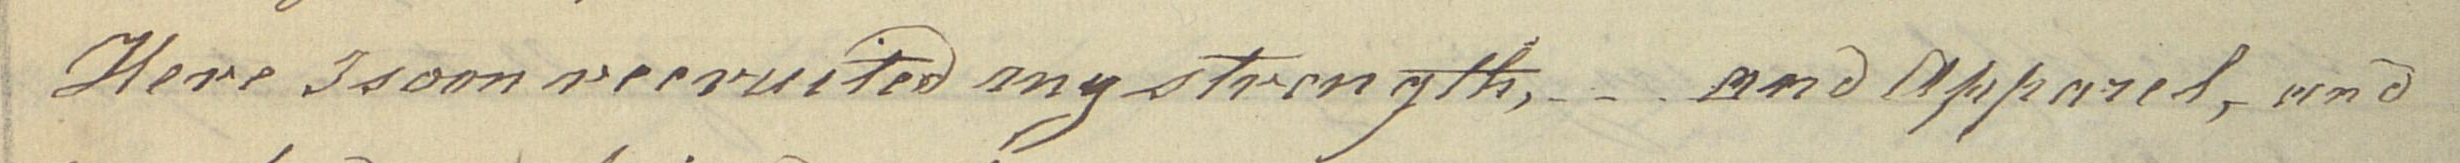Here soon recruited my strength, and Apparel, and
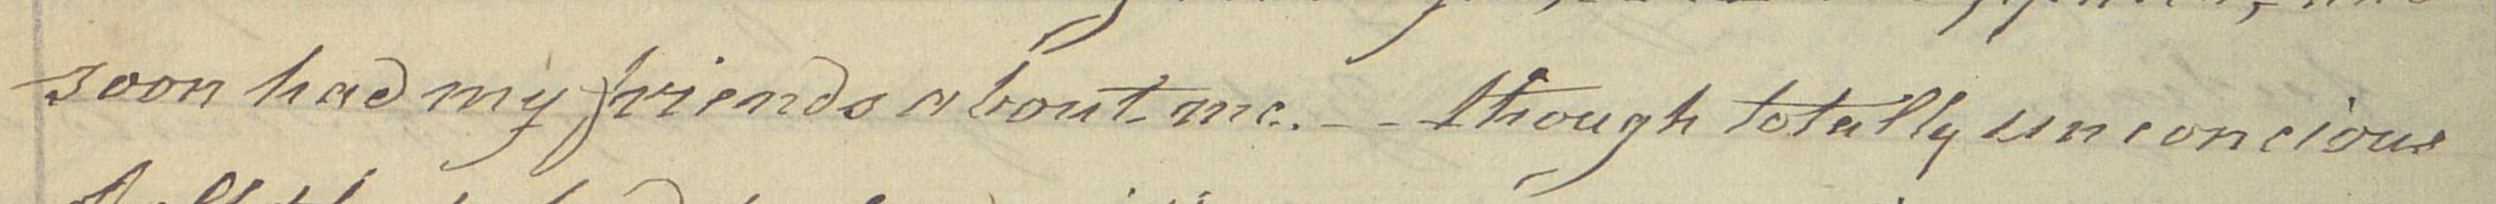soon had my friends about me. though totally unconcious
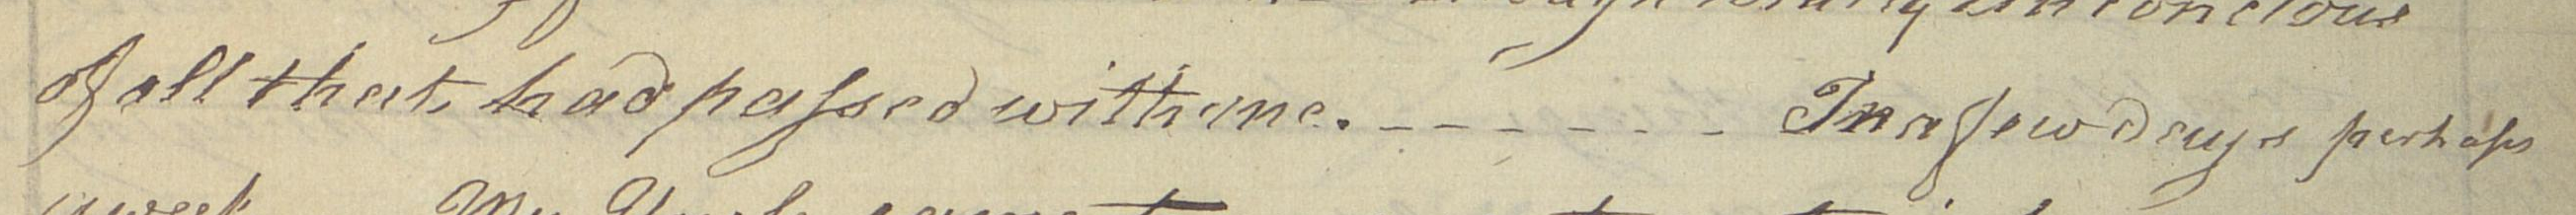of all that had passed with me. In a few days perhaps
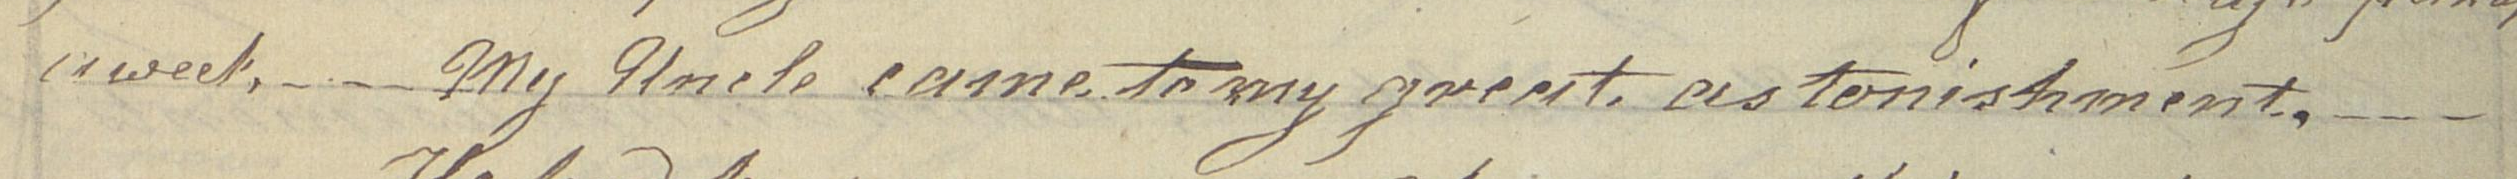a week My Uncle came to my greats astonishment.
